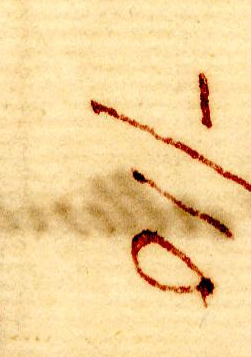-/10
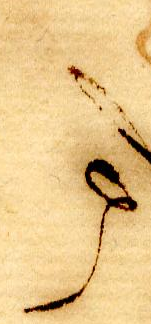To
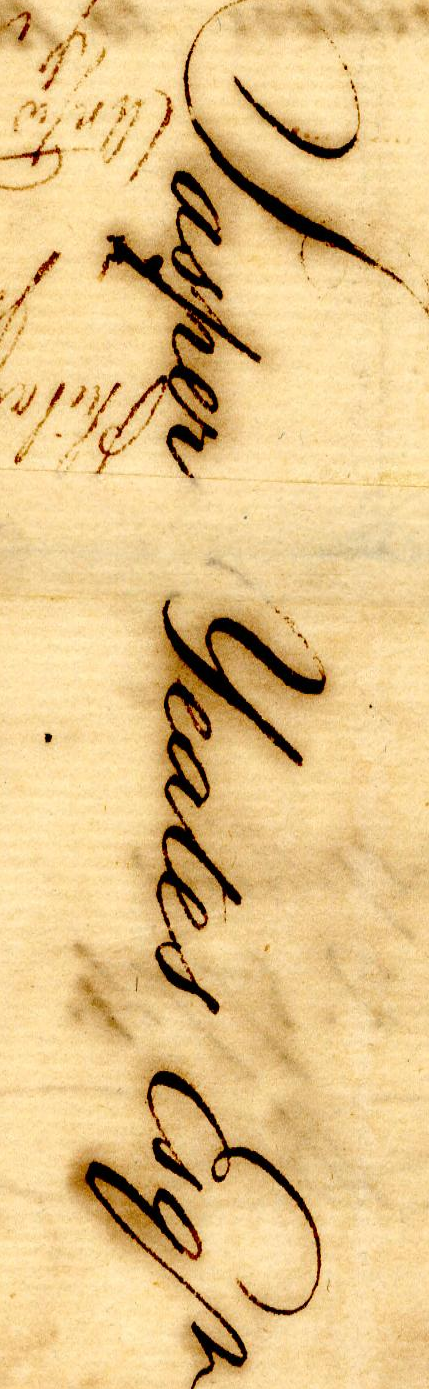Jasper Yeates Esq^r
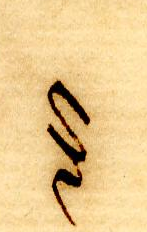in
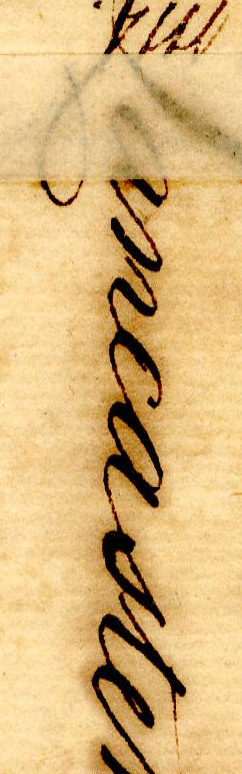Lancaster
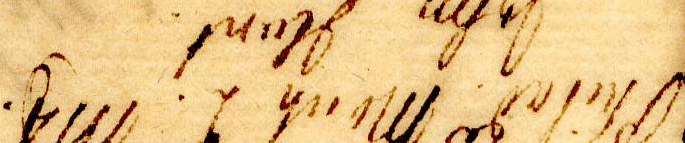Philad^a. March 2^d. 1774
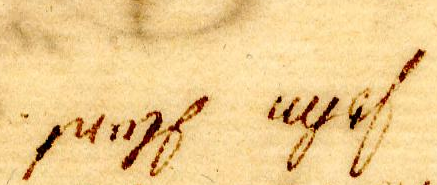John Hunt
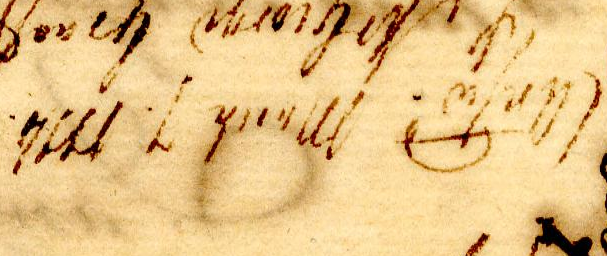(Answ^d. March 7. 1774.
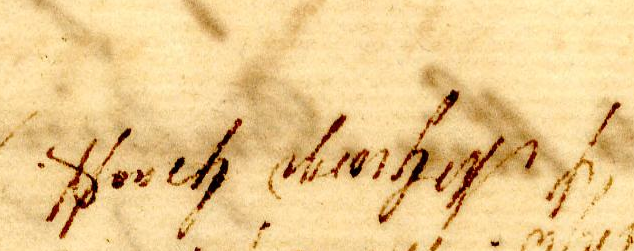Per M^r George Graff)
